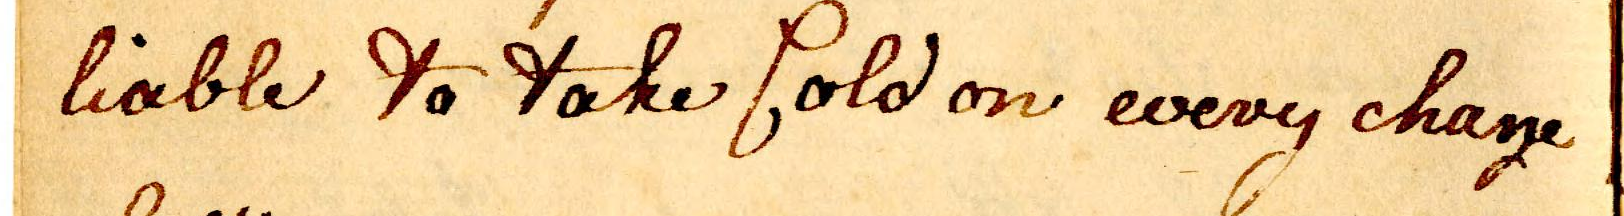liable to take Cold on every change
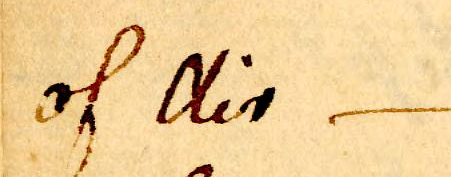of Air-
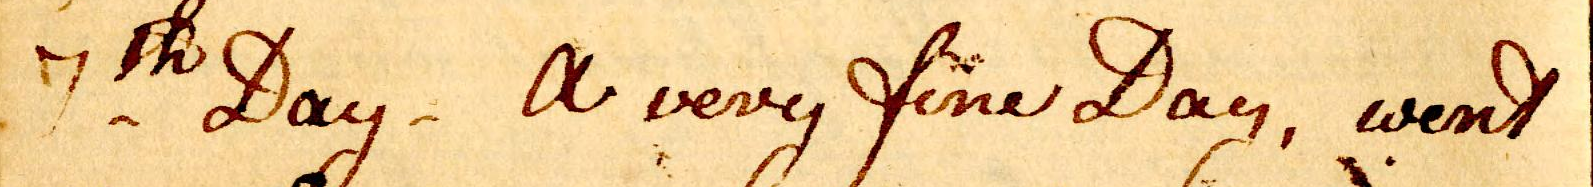7^th Day- A very fine Day, went
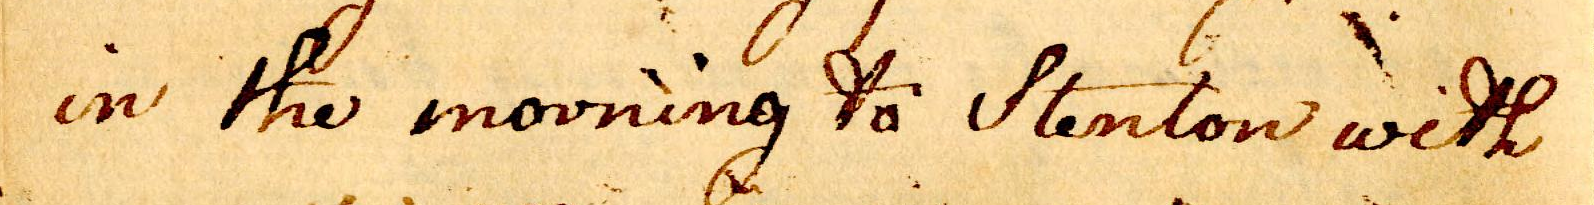in the morning to Stenton with
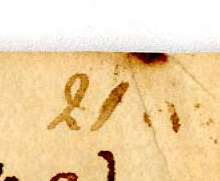21
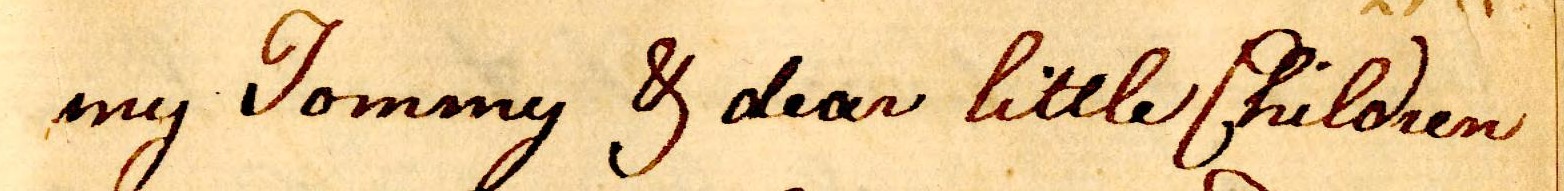my Tommy & dear little Children
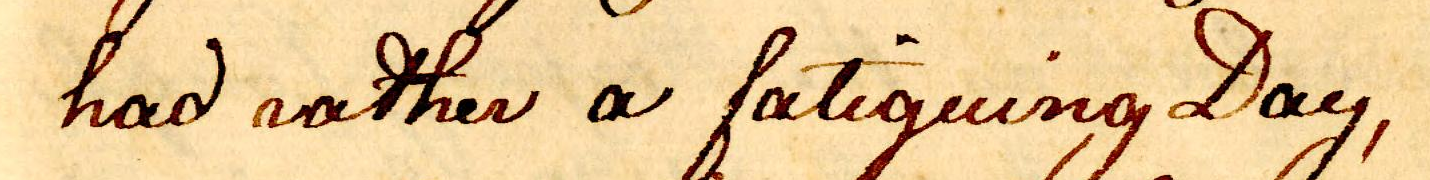had rather a fatiguing Day,
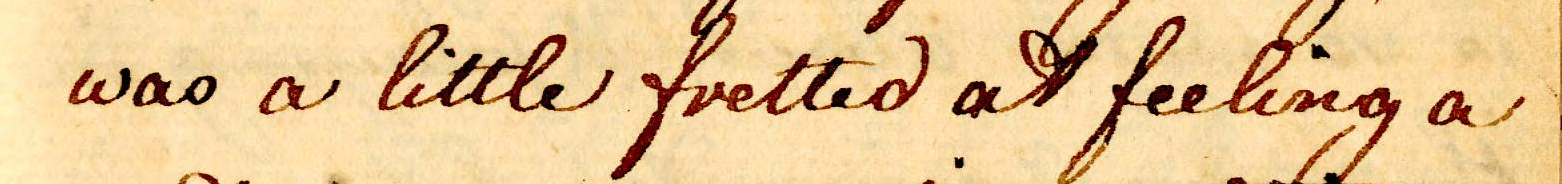was a little fretted at feeling a
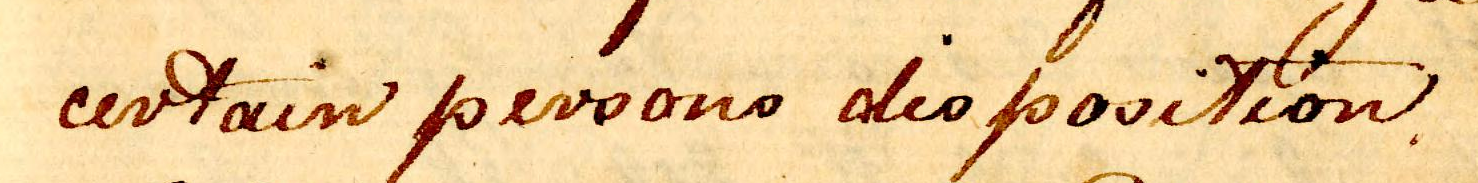certain persons disposition
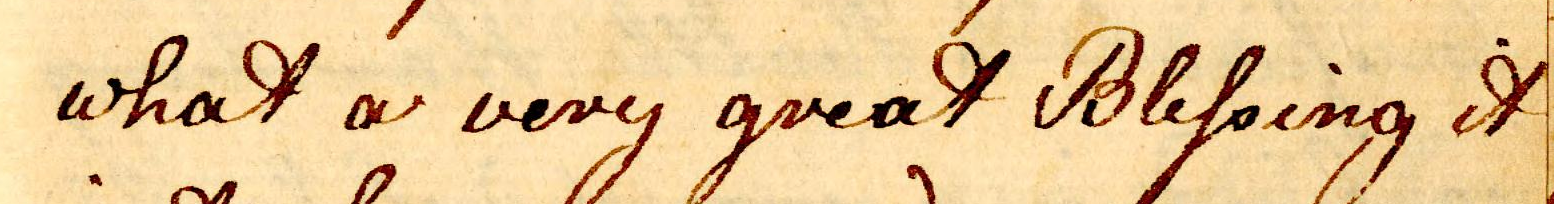what a very great Blessing it
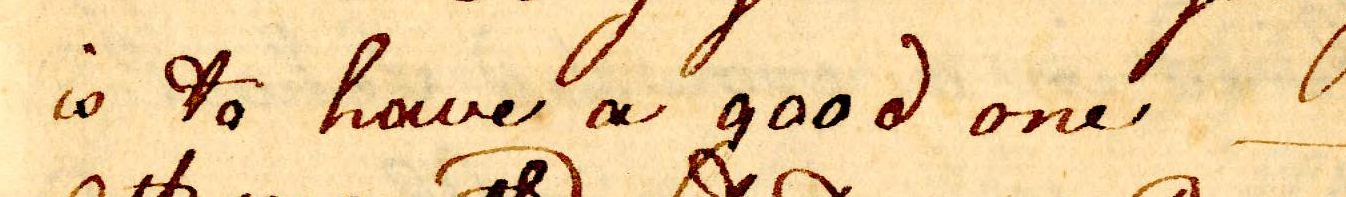is to have a good one
